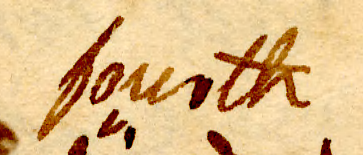fourth
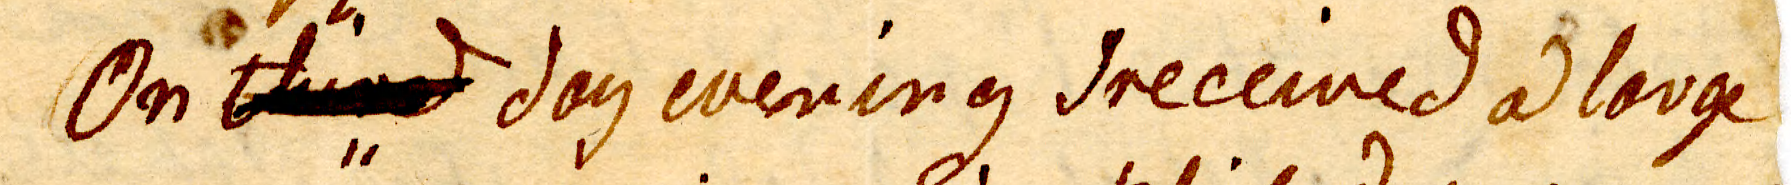On [third] ^ day evening I received a large
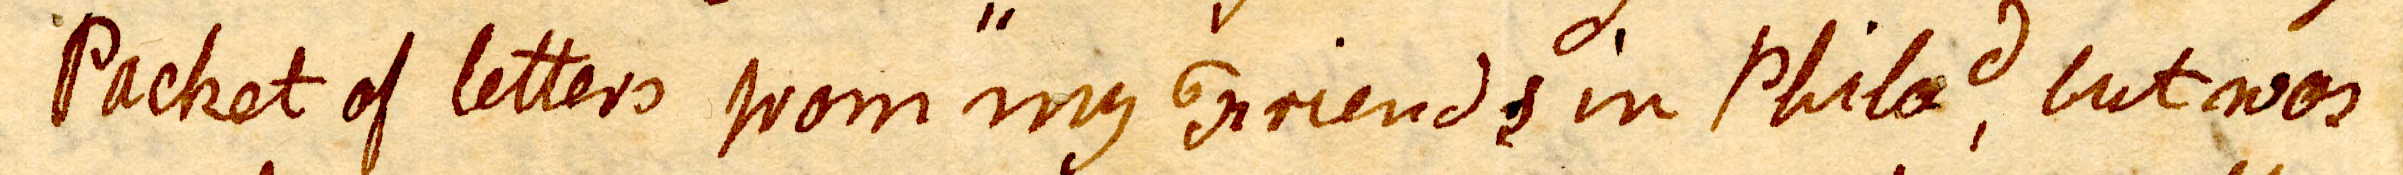Packet of letters from my friends in Phila^d, but was
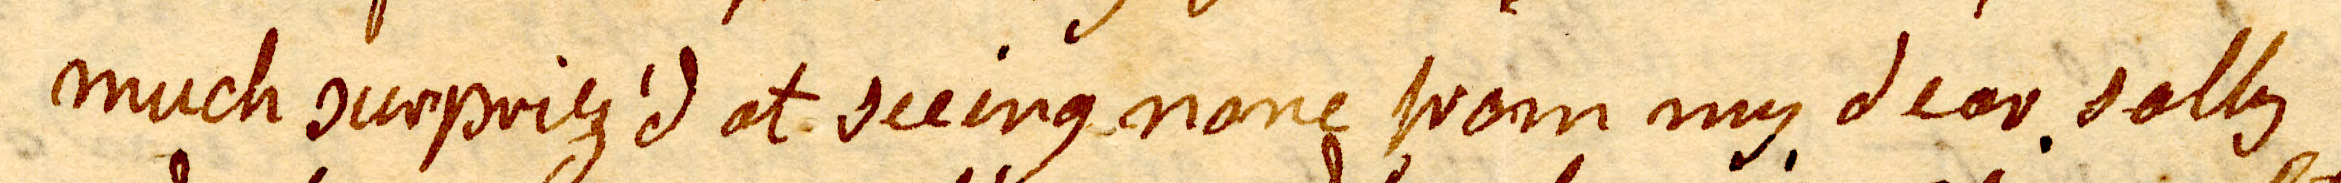much surpriz'd at seeing none from my dear sally
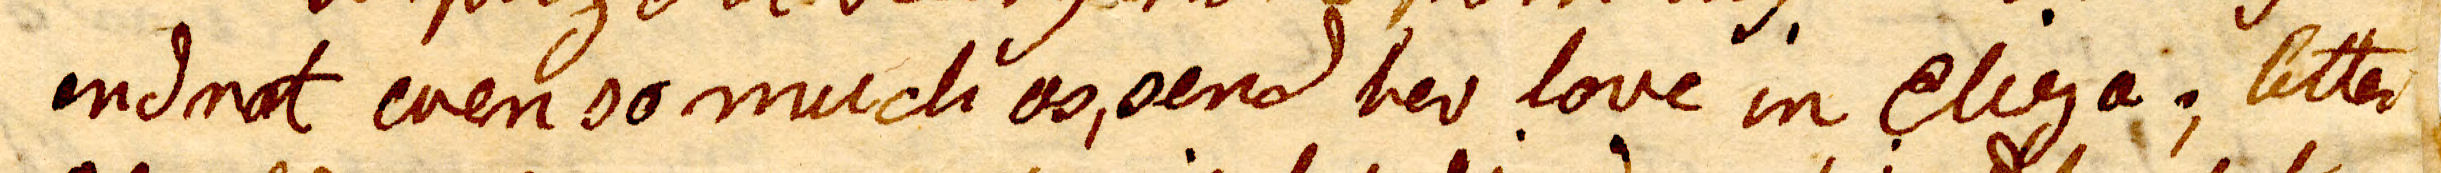and not even so much as, send her love in Eliza. letter.
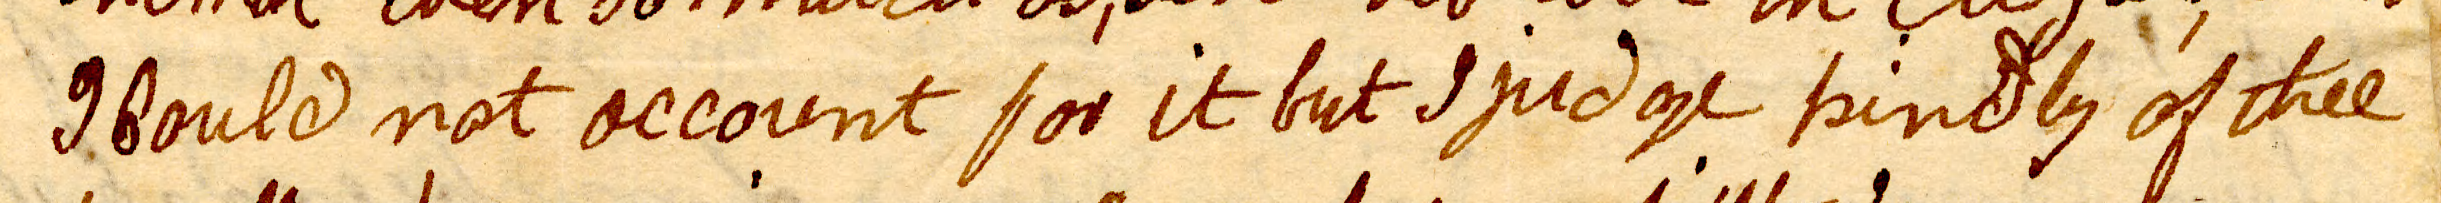I could not account for it but I judge kindly of thee
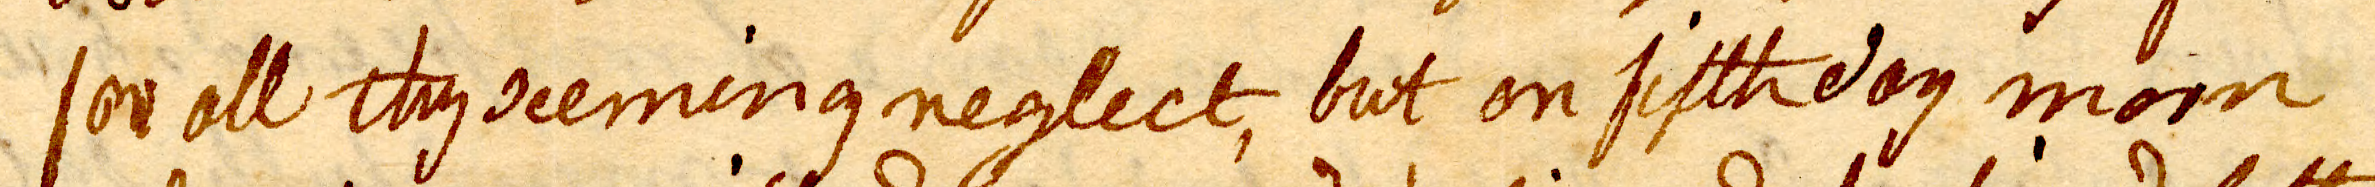for all thy seeming neglect, but on fifth day morn
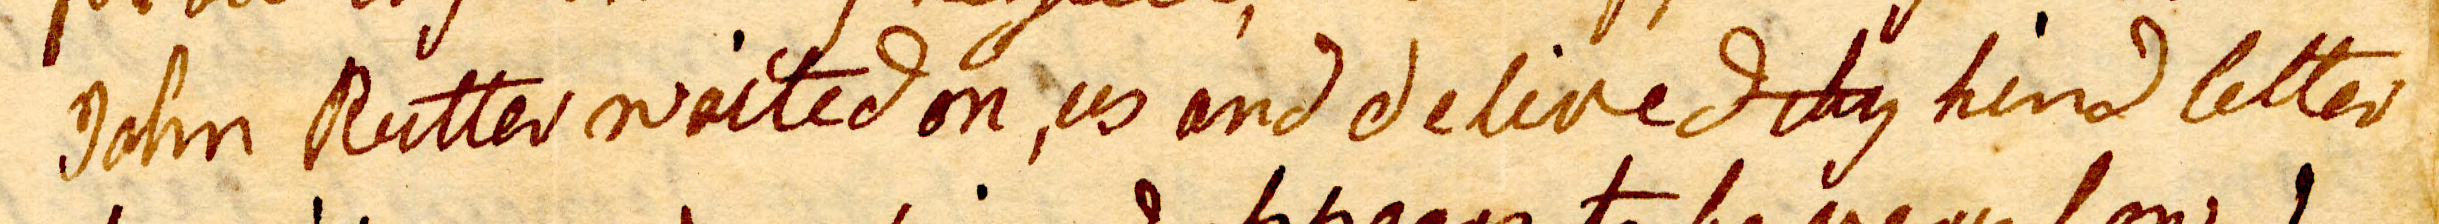John Rutter waited on us and delivered thy kind letter
